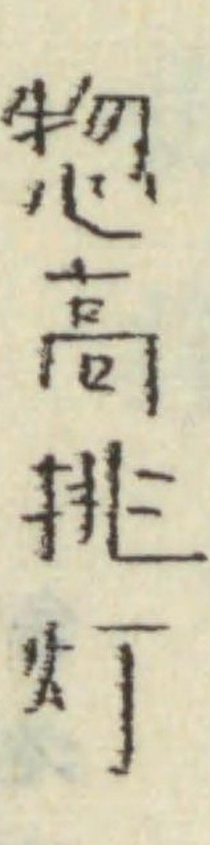惣高挑灯
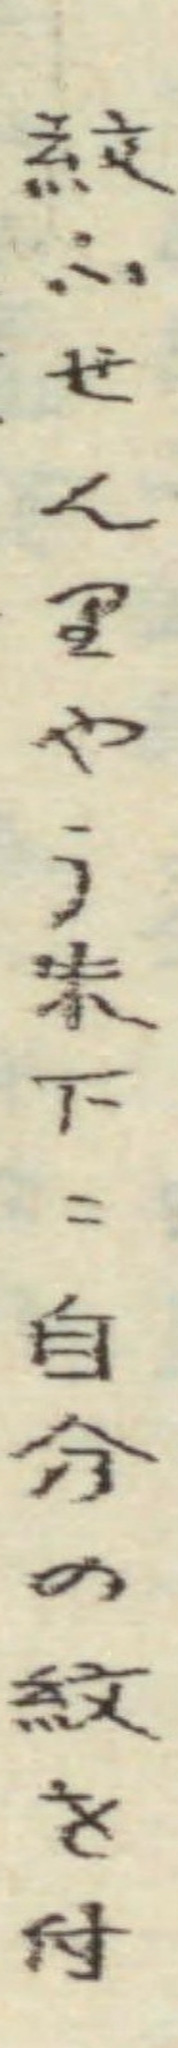紋ふせんりやう朱下二自分の紋を付
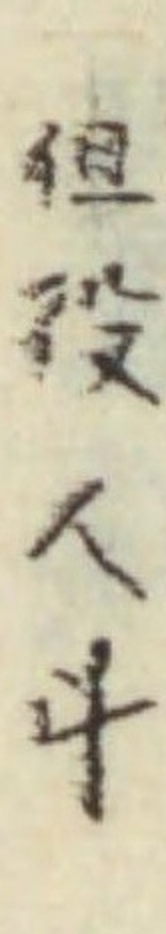但役人斗
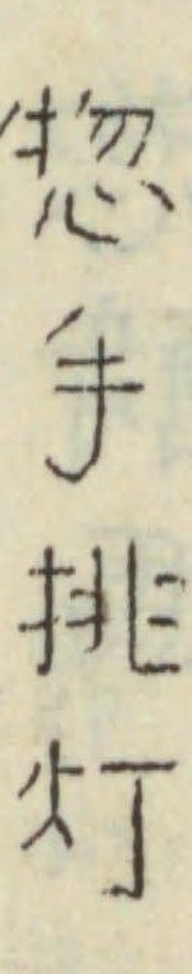惣手挑灯
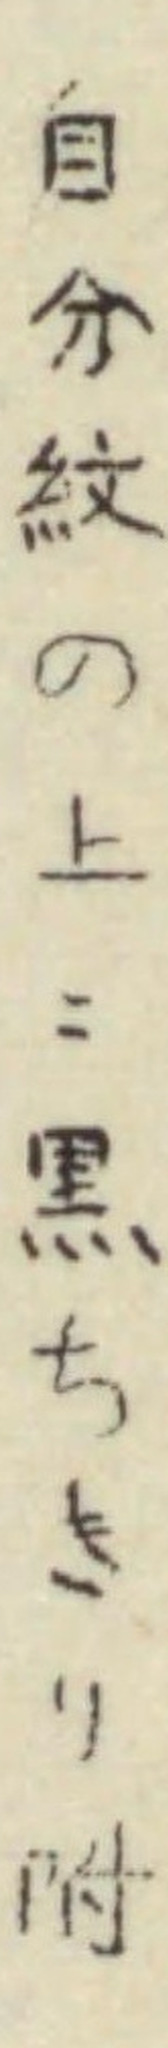自分紋の上二黒ちきり附
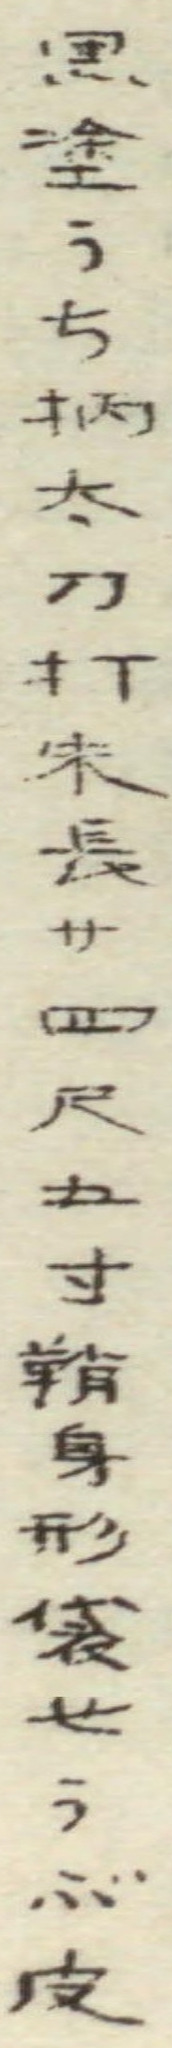黒塗うち柄太刀打朱長サ四尺五寸鞘己身形袋せうぶ皮
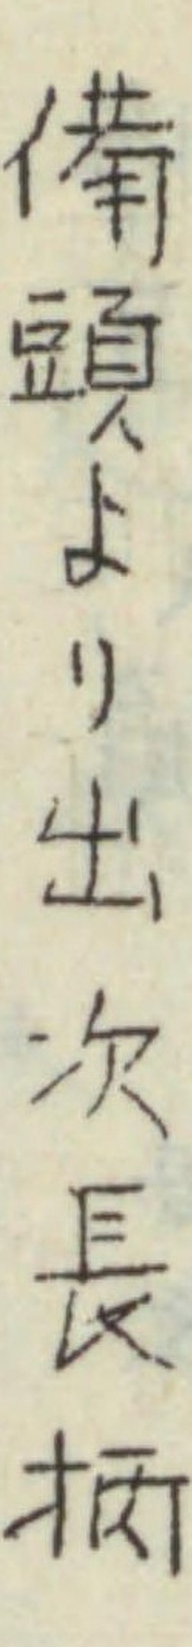備頭より出次長柄
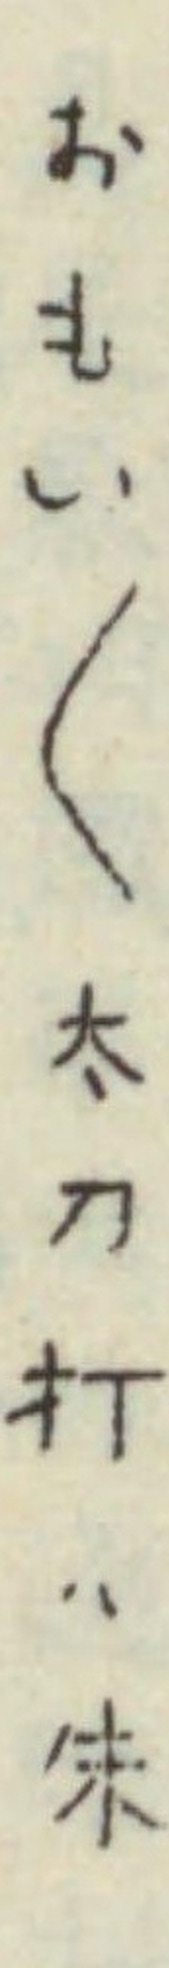おもい〳〵太刀打ハ朱
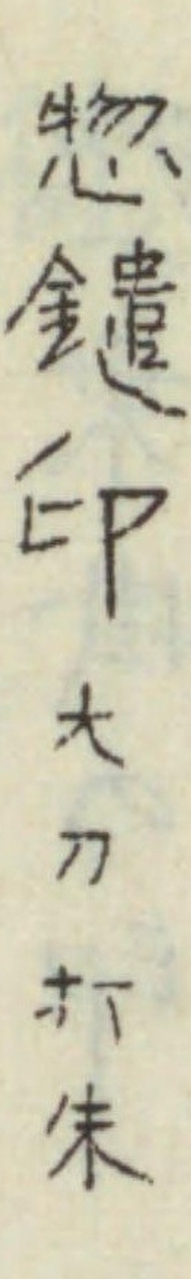惣鑓陰太刀打朱
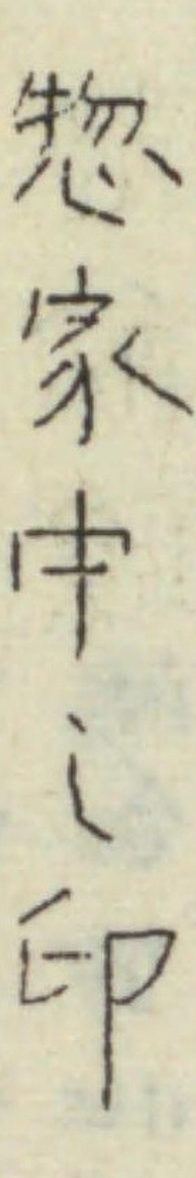惣家中之印
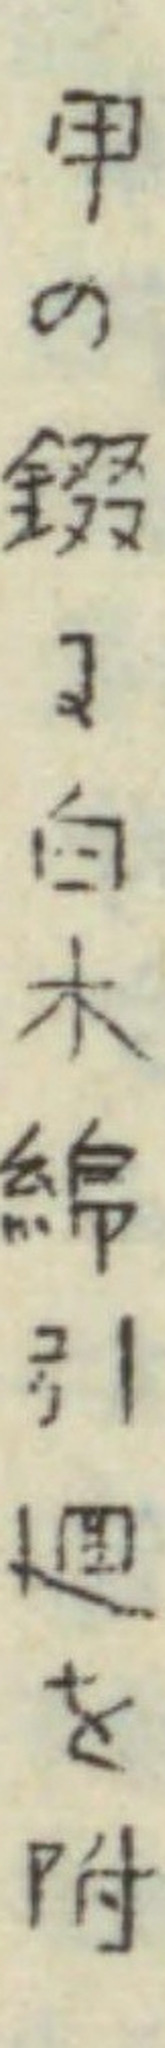甲の錣に白木錦引廻を附
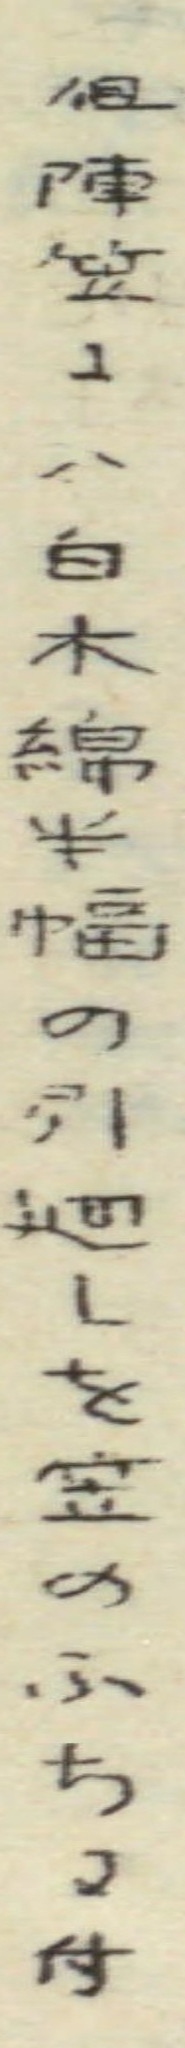但陣笠にハ白木綿半幅の引廻しを笠のふちに付
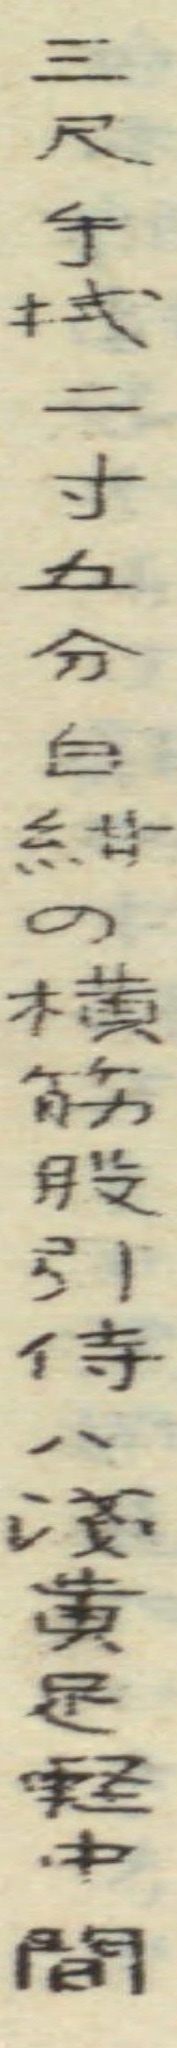三尺手拭二寸五分白緋の横筋股引侍ハ浅黄足軽中間
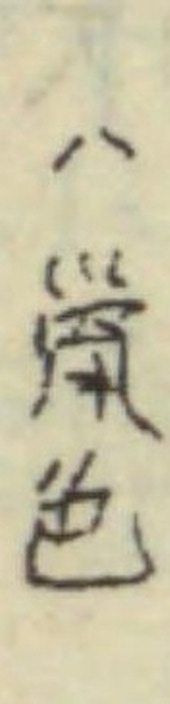ハ鼠色

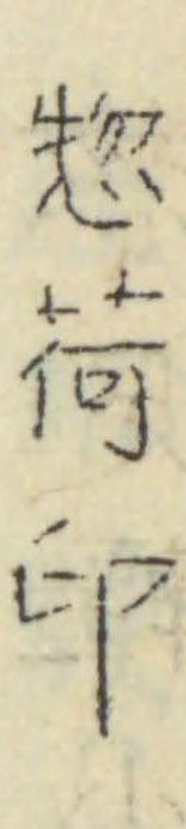惣荷印
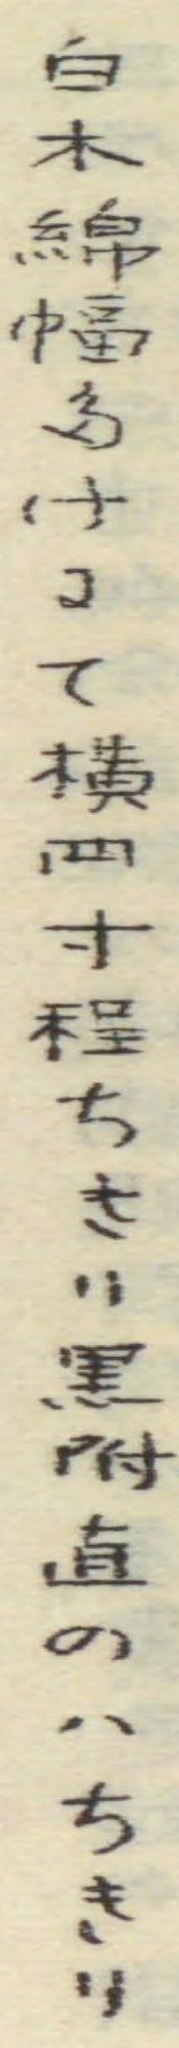白木綿幅たけにて横四寸程ちさい黒附直のちきり
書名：三河吉田藩動員史料
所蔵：国立国会図書館 National Diet Library, JAPAN
